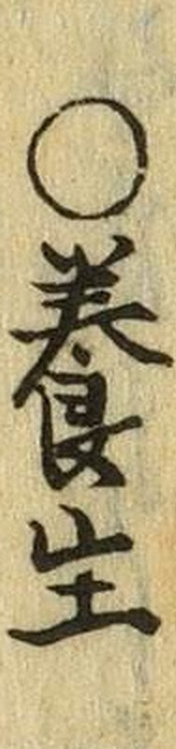◯養生
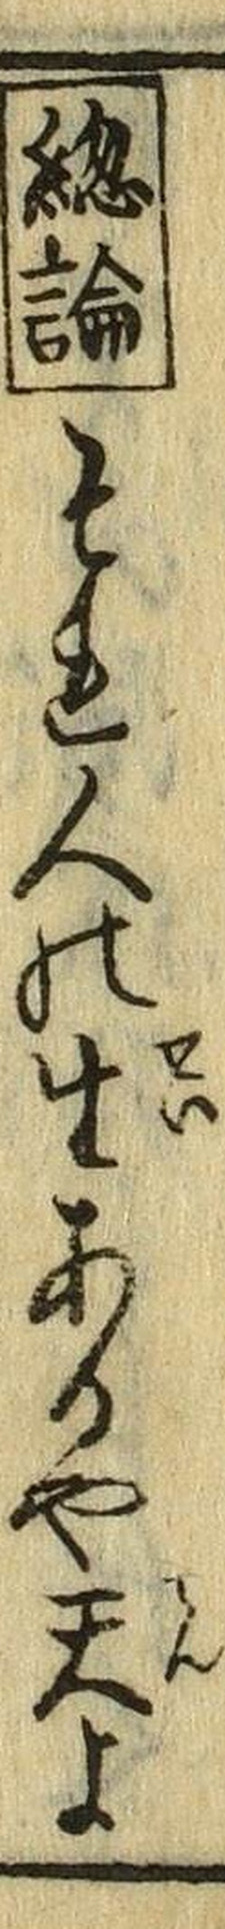総論それ人の生あるや天よ
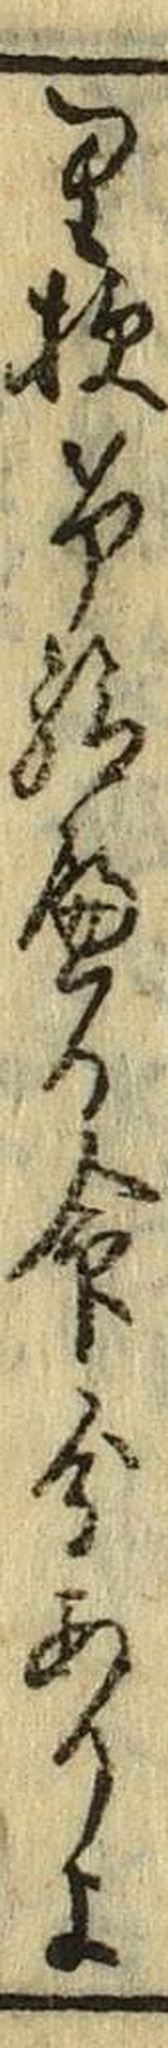り授け給へる命分ありよ
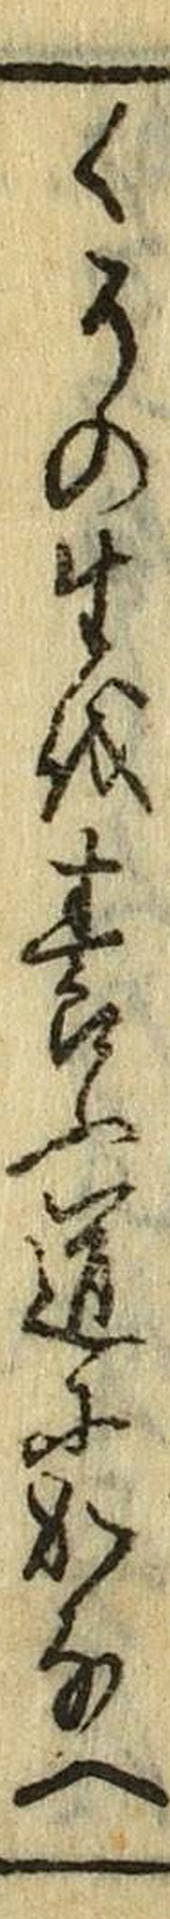くその生を養ふ道にかなへ
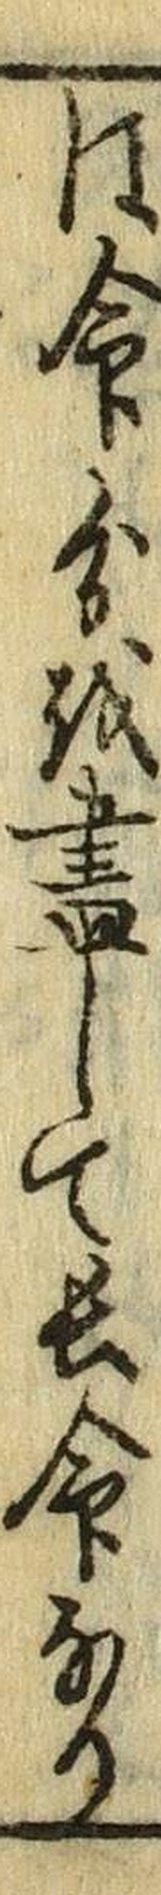ば命分を尽して長命なり
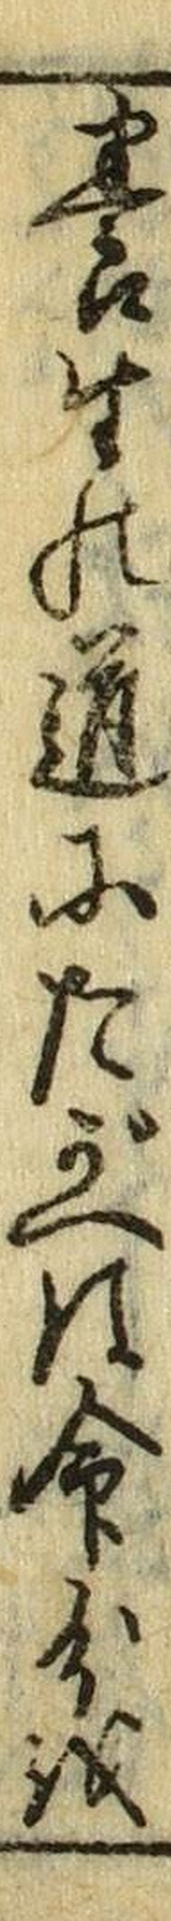養生の道にたがへは命分を
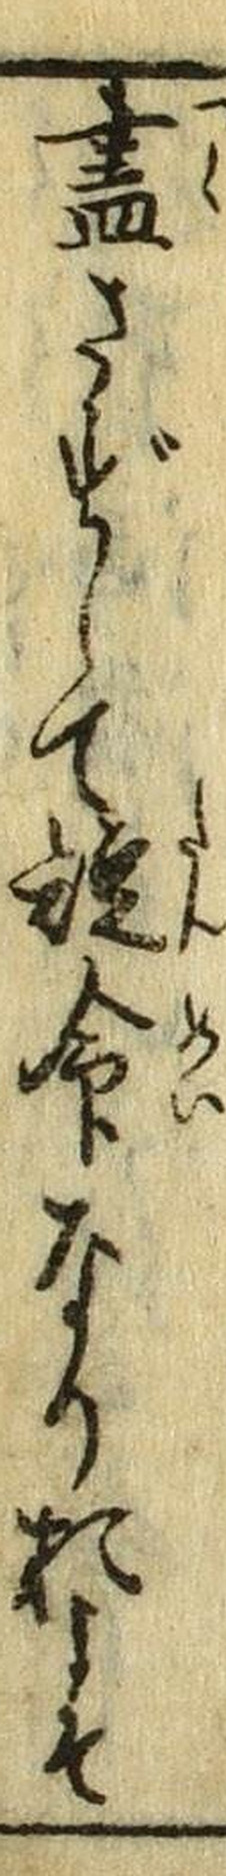尽さずして短命なりおよそ
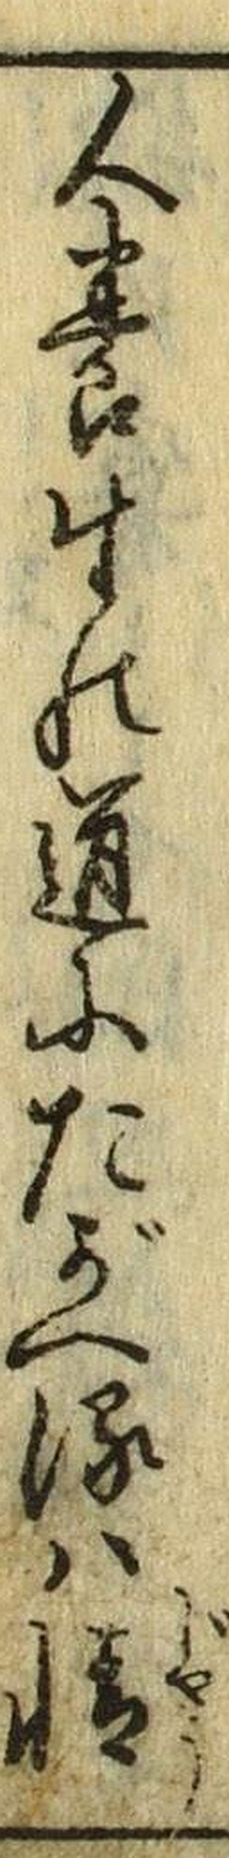人養生の道にたがへるは情
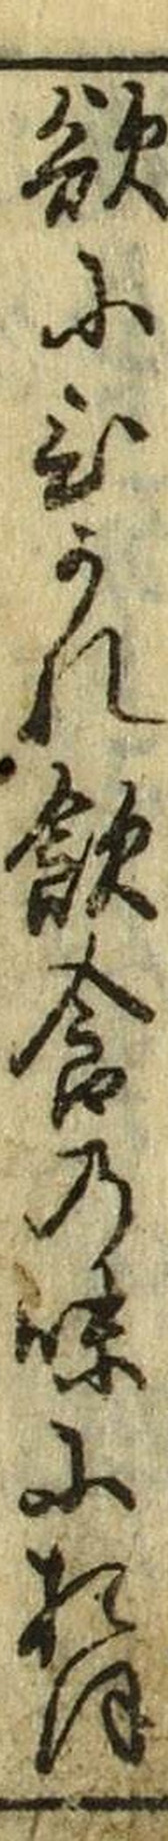欲にひかれ飲食の味におぼ
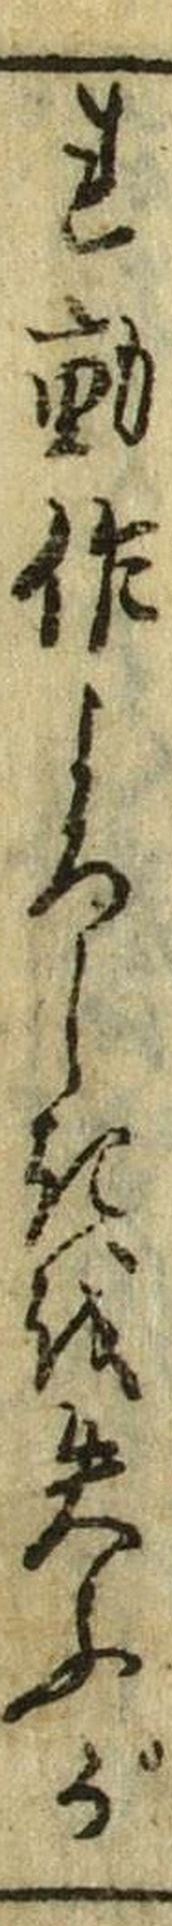れ動作よろしきを失ふが

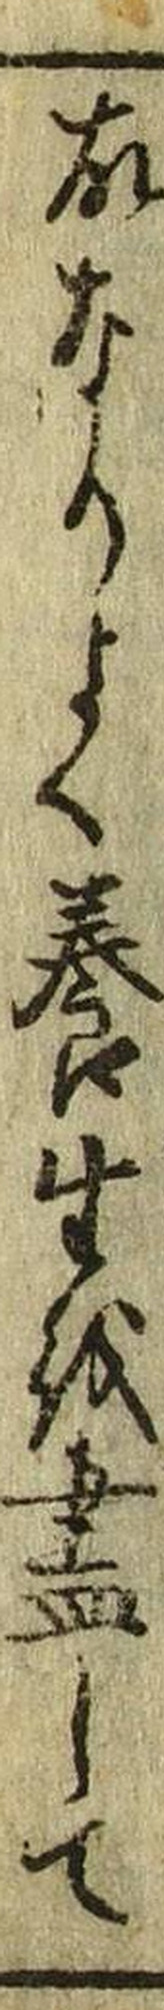故なりよく養生を尽して
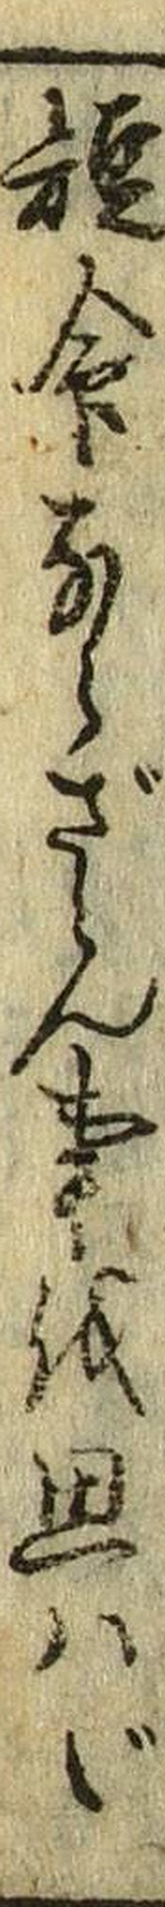短命ならざらん事を思はゞ
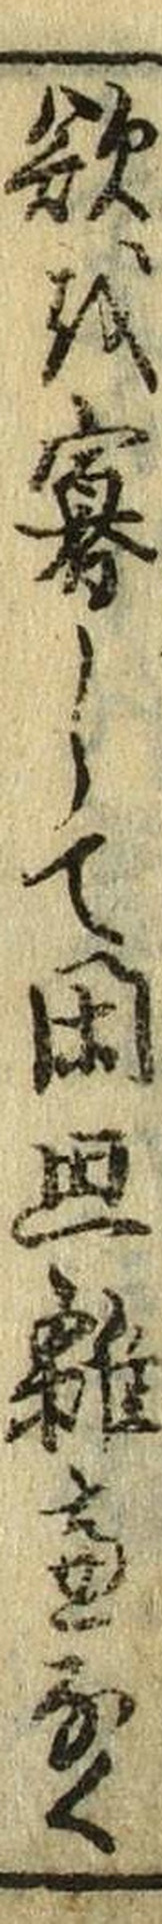欲を寡して閑思雑慮なく
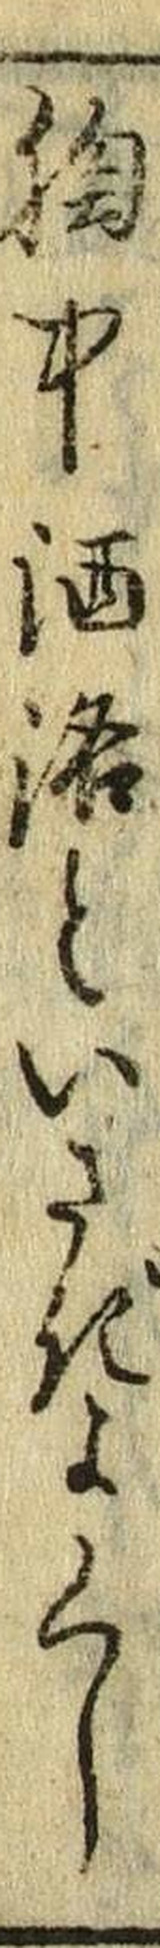胸中洒洛といさぎよくし
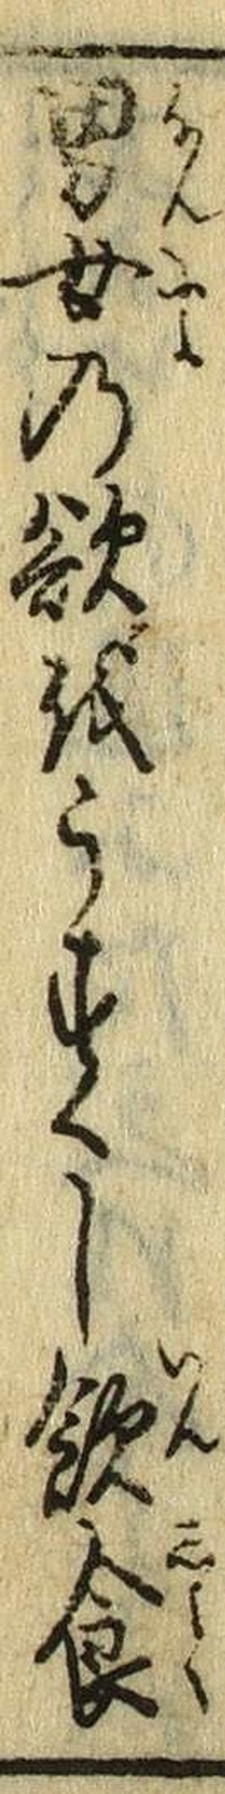男女の欲をうすくし飲食
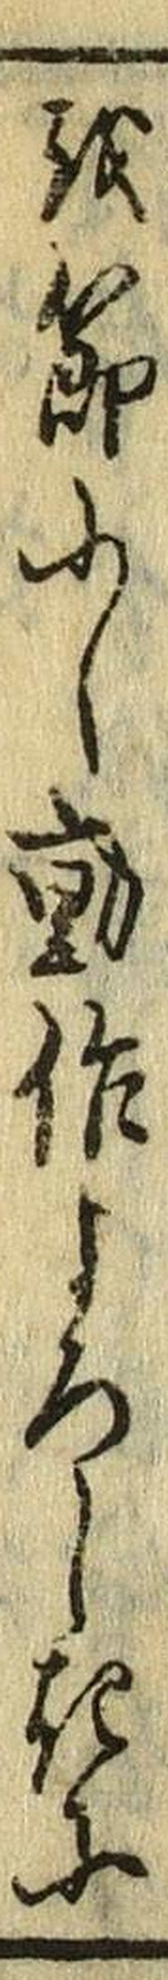を節にし動作よろしきに
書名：居家養生記
